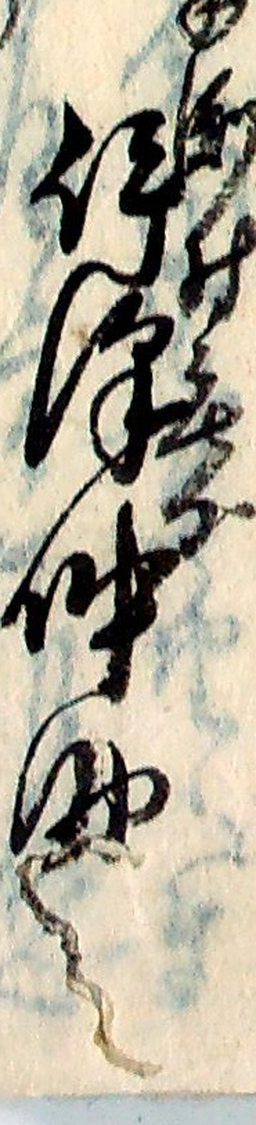伊沢仲助
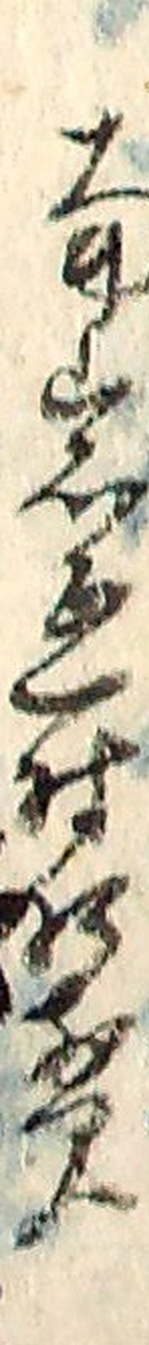南岩延村肝煎
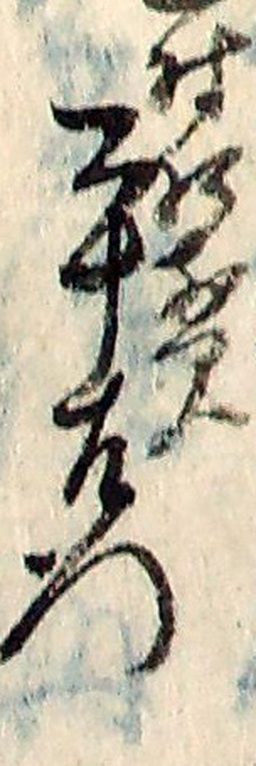平左衛門
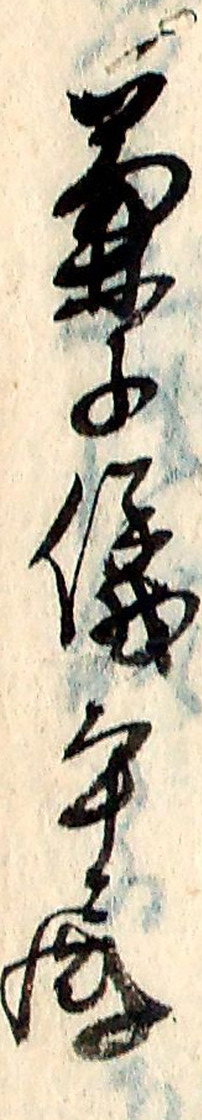兼子儀平殿

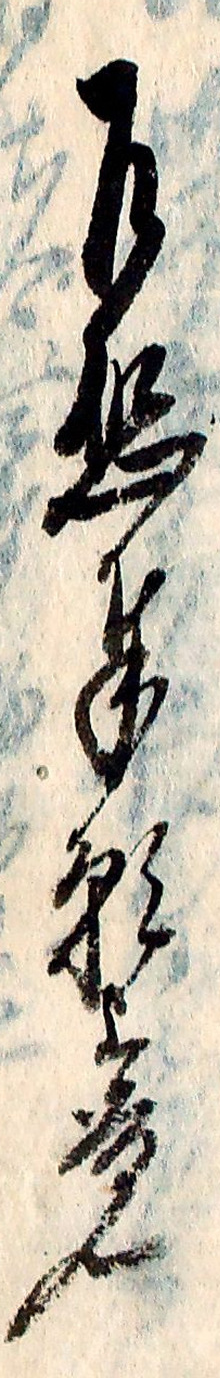乍恐奉願上覚
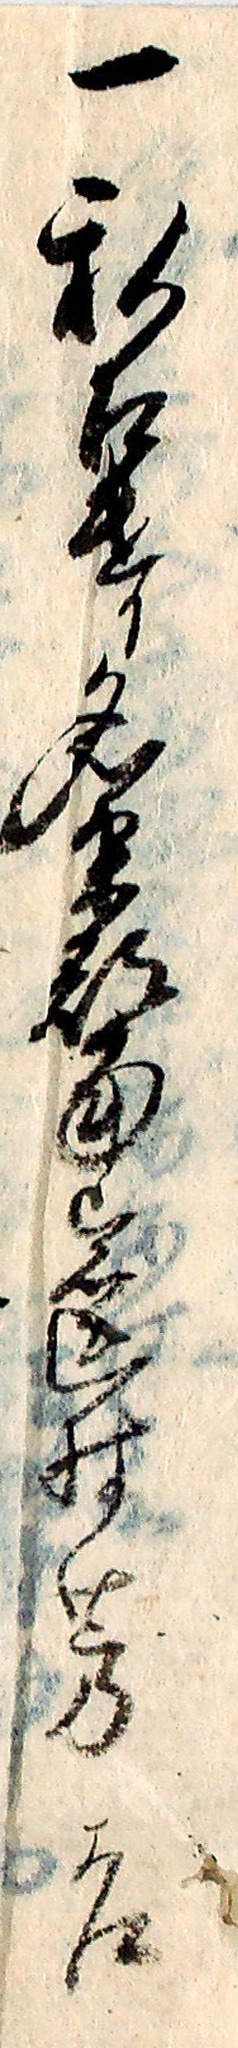一私召遣い名東郡南岩延村芳吉
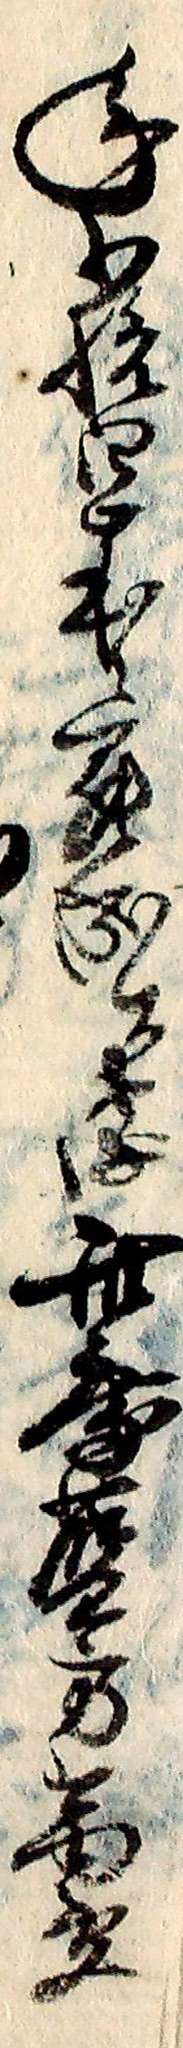年五拾四歳に罷成候処此度藍方商売
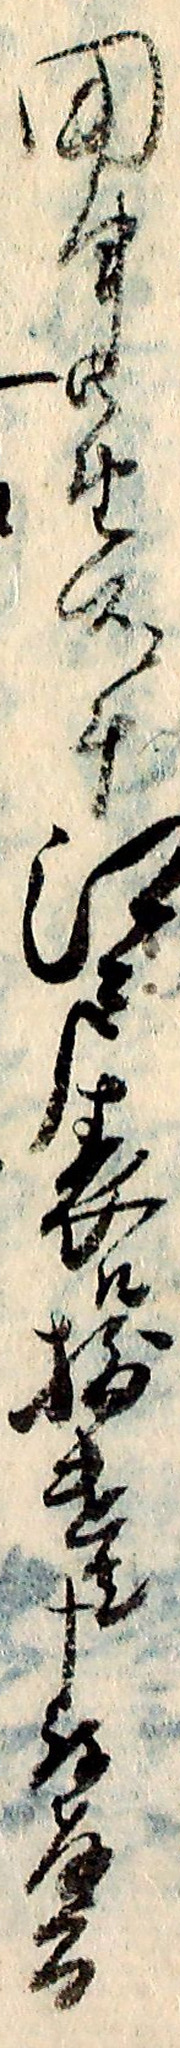用事御座候に付江戸表え指遣し申度奉存候間
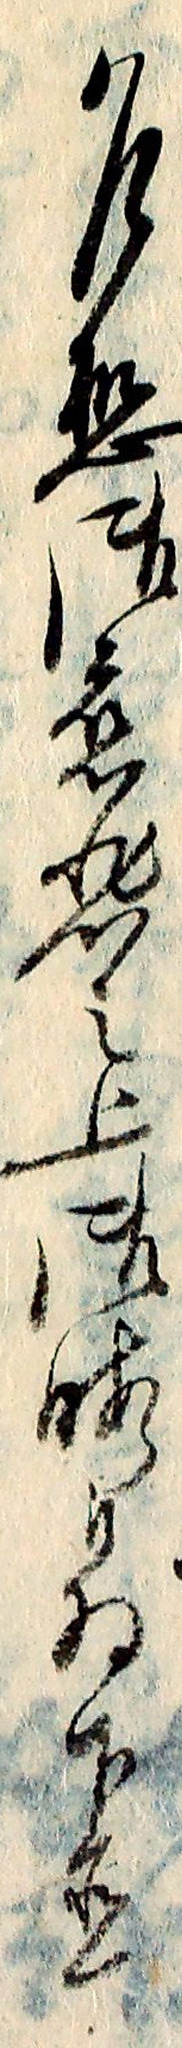乍恐御慈悲之上御暇被為下置
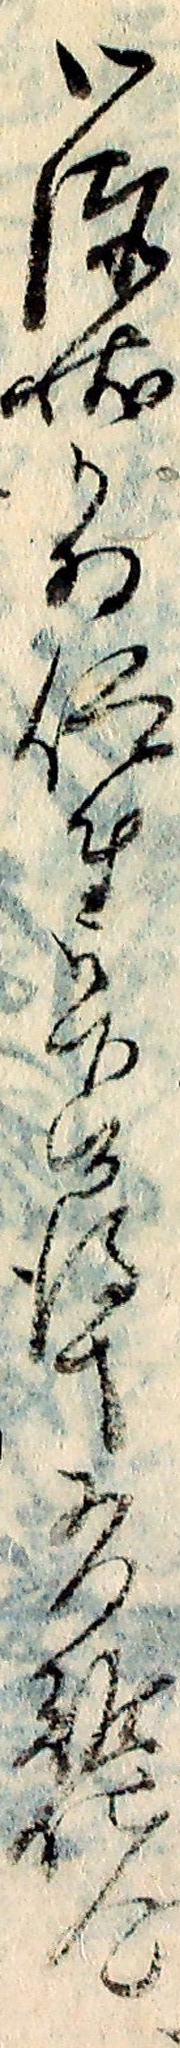御添状被為仰付被下候得は有難仕合に
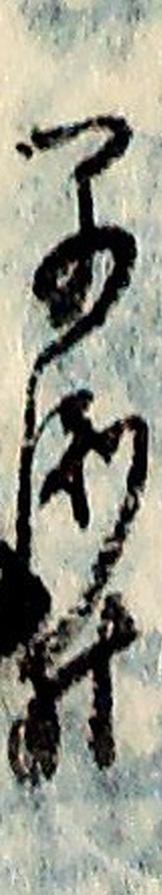早淵村
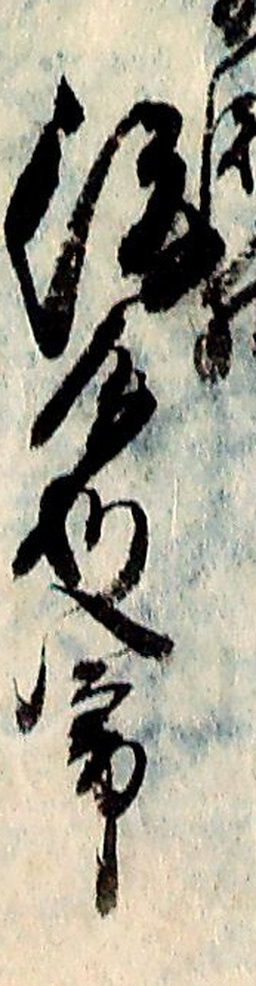後藤利八郎
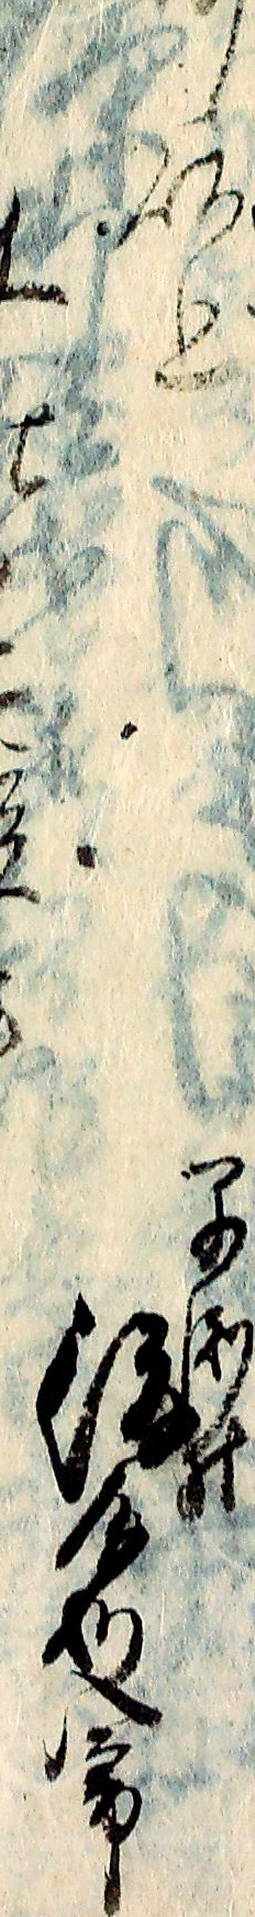後藤利八郎
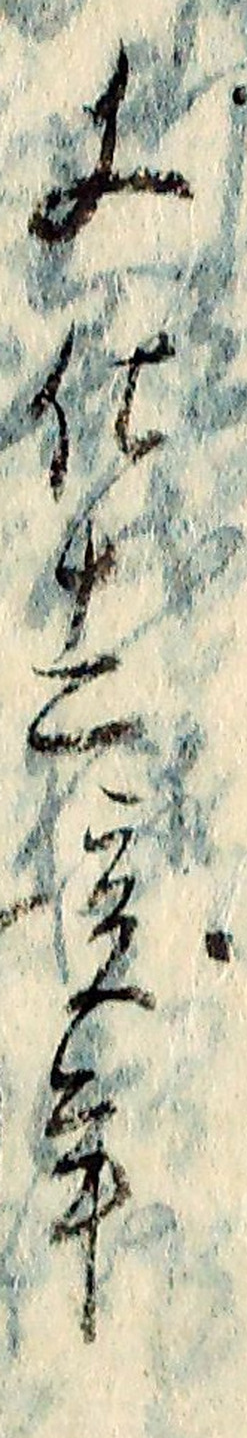文化十二亥年
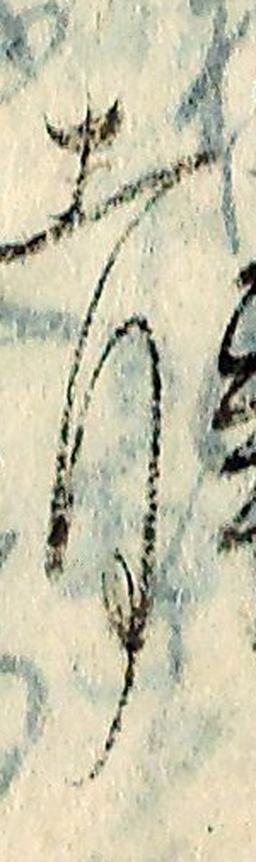十一月
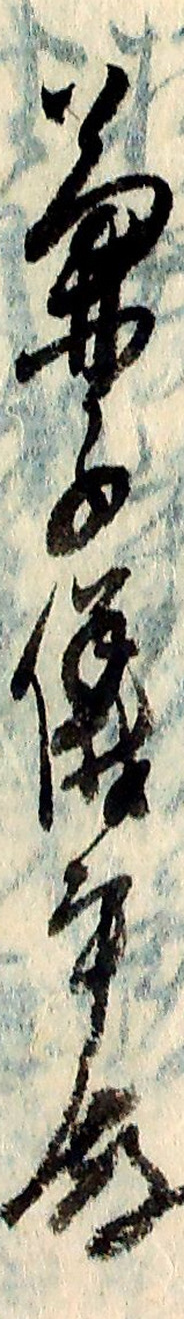兼子儀平殿
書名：諸御願書控(後藤氏壱番）
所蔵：鳴門教育大学 Naruto University of Education
